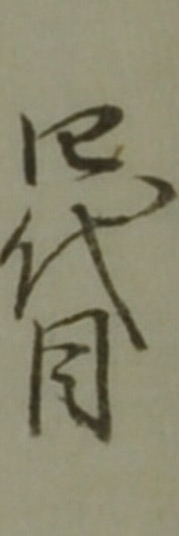四代目
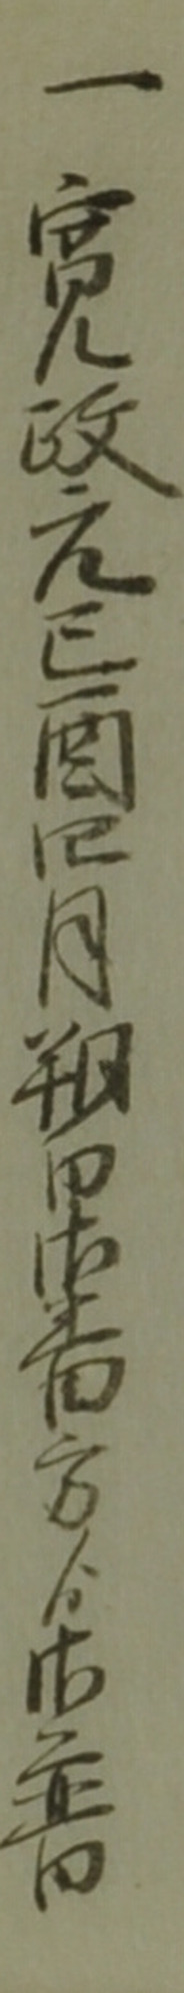一寛政元己酉四月朔日御番方ゟ御普
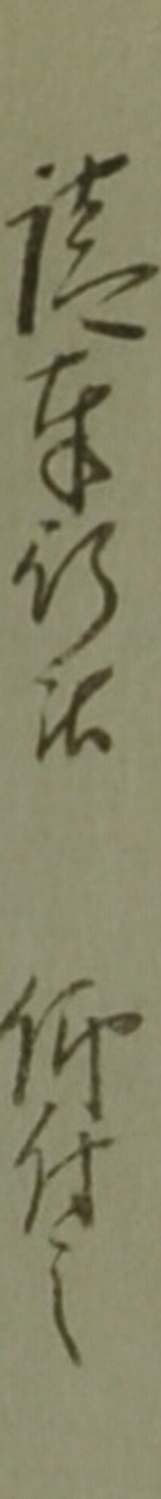請奉行被仰付之
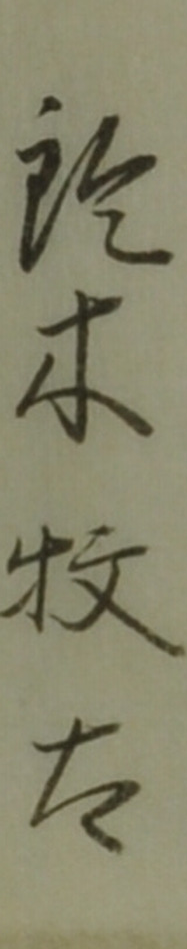鈴木牧太
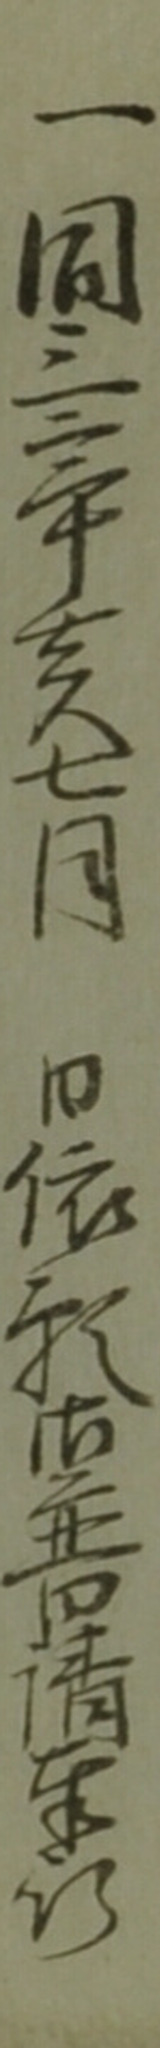一同三辛亥七月日依願御普請奉行
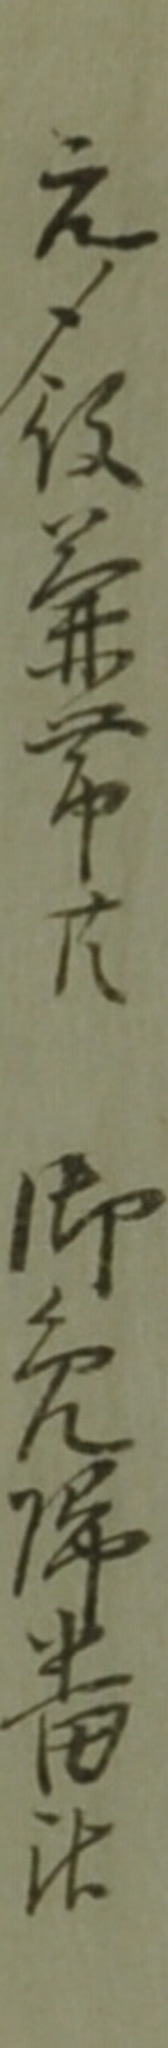元〆役兼帯共御免帰番被
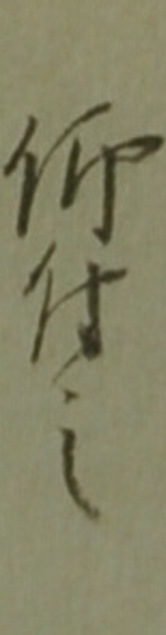仰付之
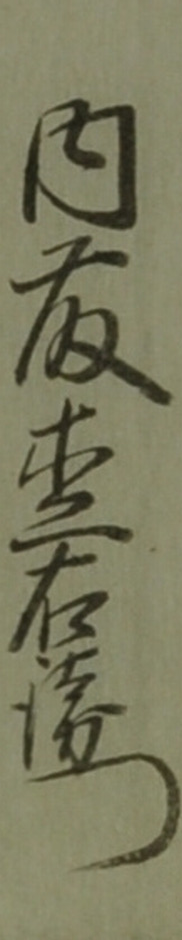内藤杢右衛門
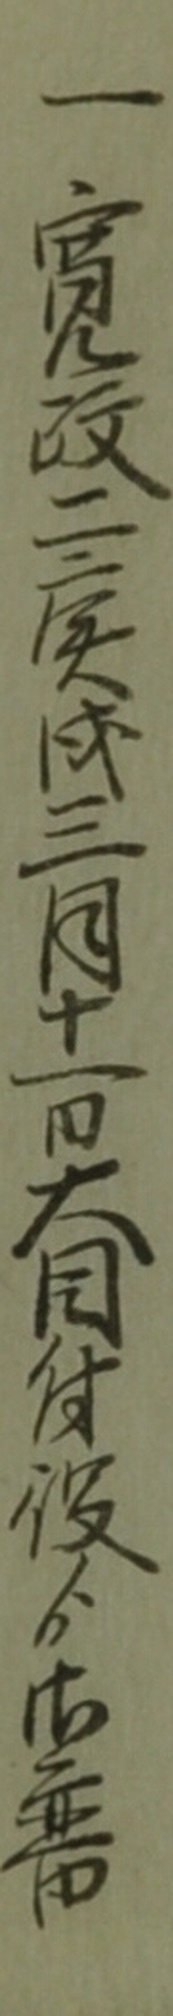一寛政二庚戌三月十一日大目付役ゟ御普
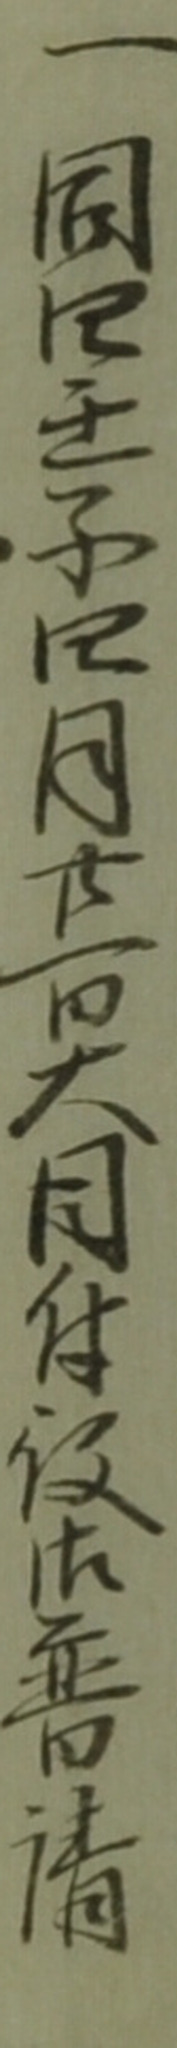一同四壬子四月廿一日大目付役御普請
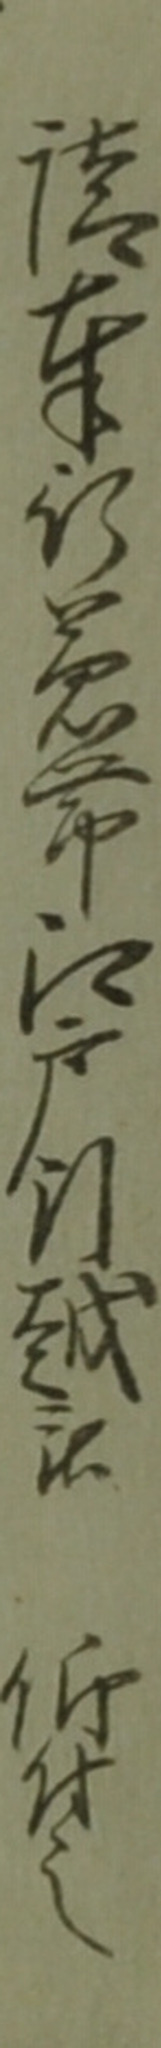請奉行兼帯江戸引越被仰付之
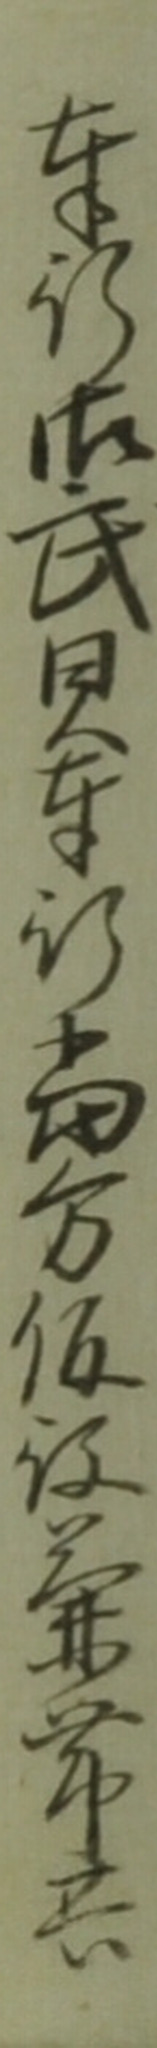奉行御武具奉行当方仮役兼帯共

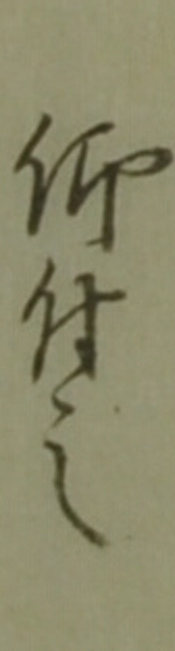仰付之
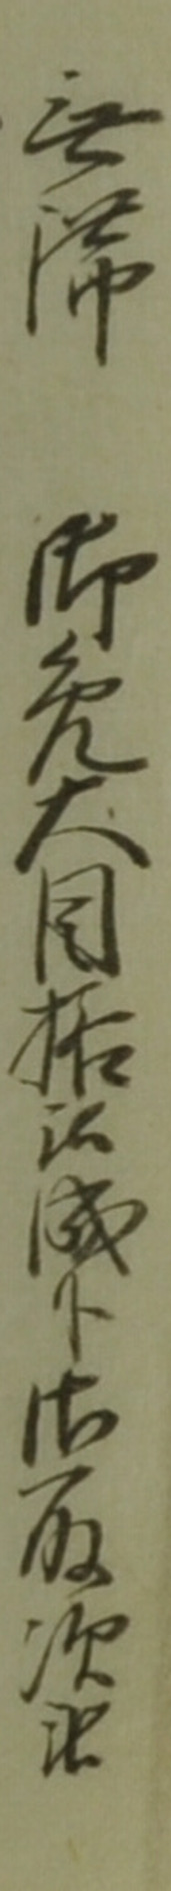無滞御免大目格被成下御取次被
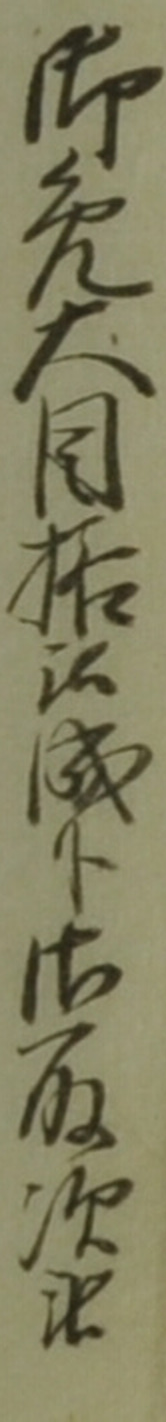無滞御免大目格被成下御取次被
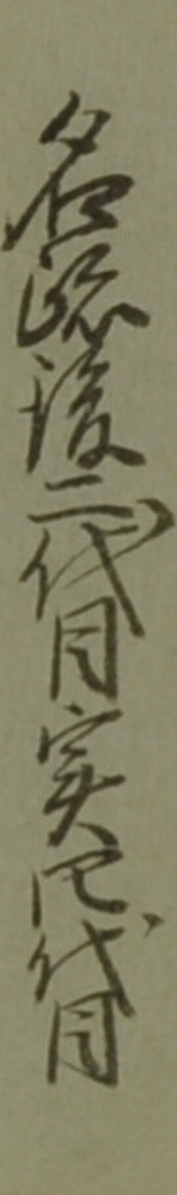名跡後二代目実四代目
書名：諸御役代々録（六）
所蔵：伊那市立高遠町図書館・合同会社AMANE
